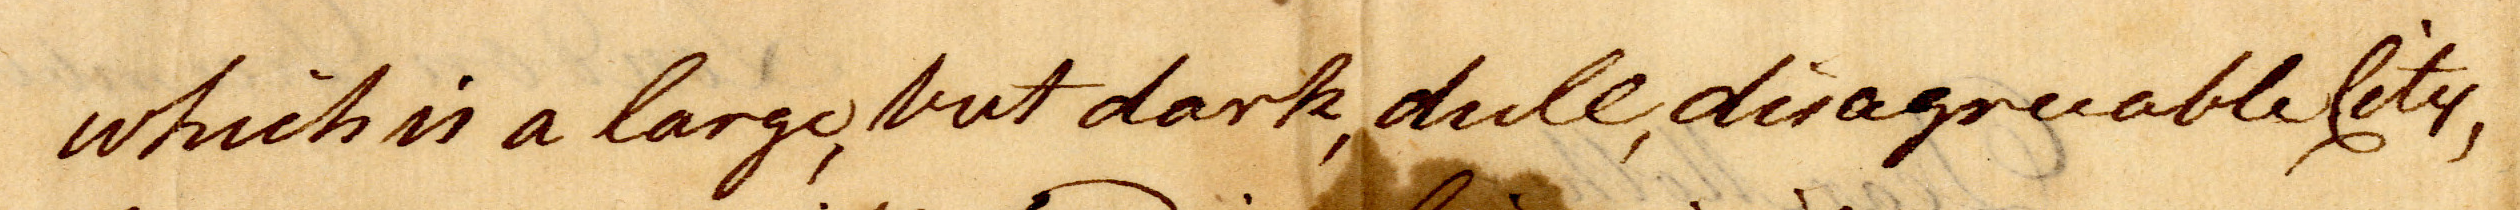which is a large, but dark, dull, disagreeable City,
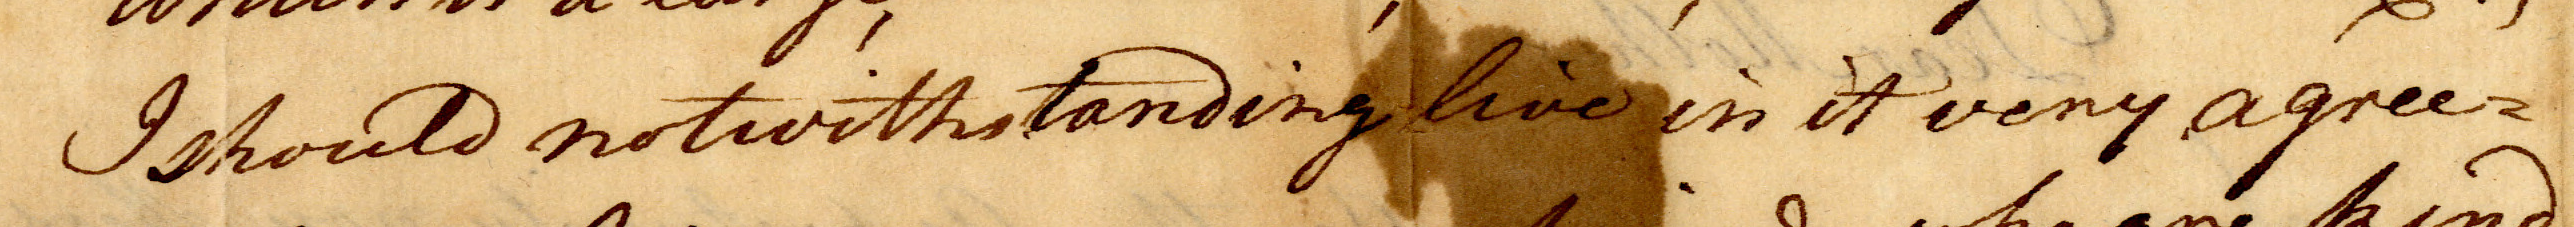I should notwithstanding live in it very agree-
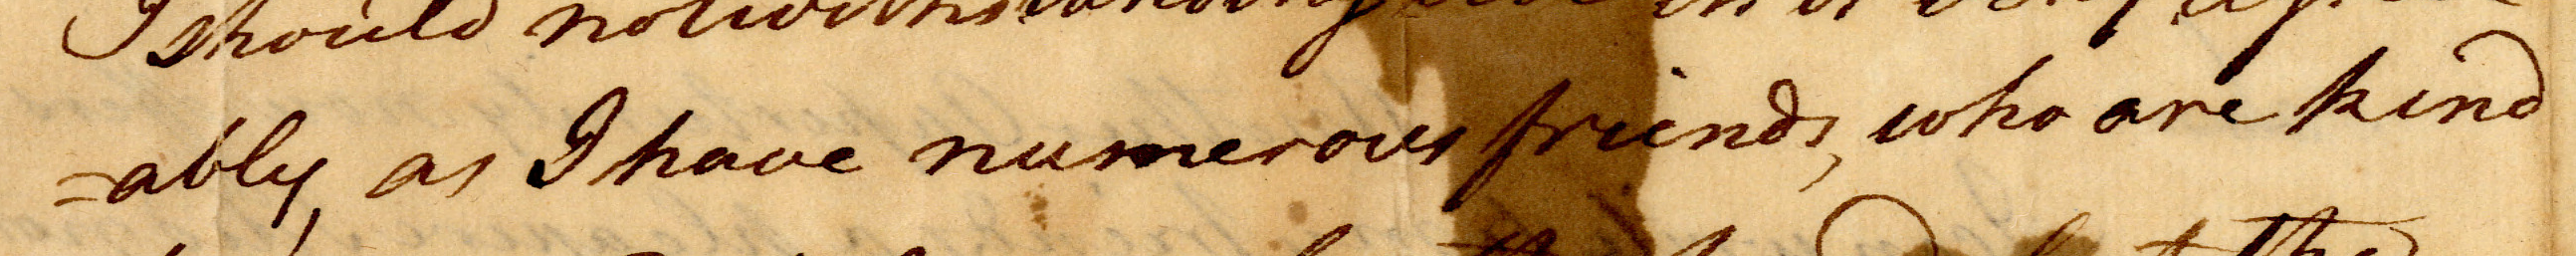-ably, as I have numerous friends, who are kind
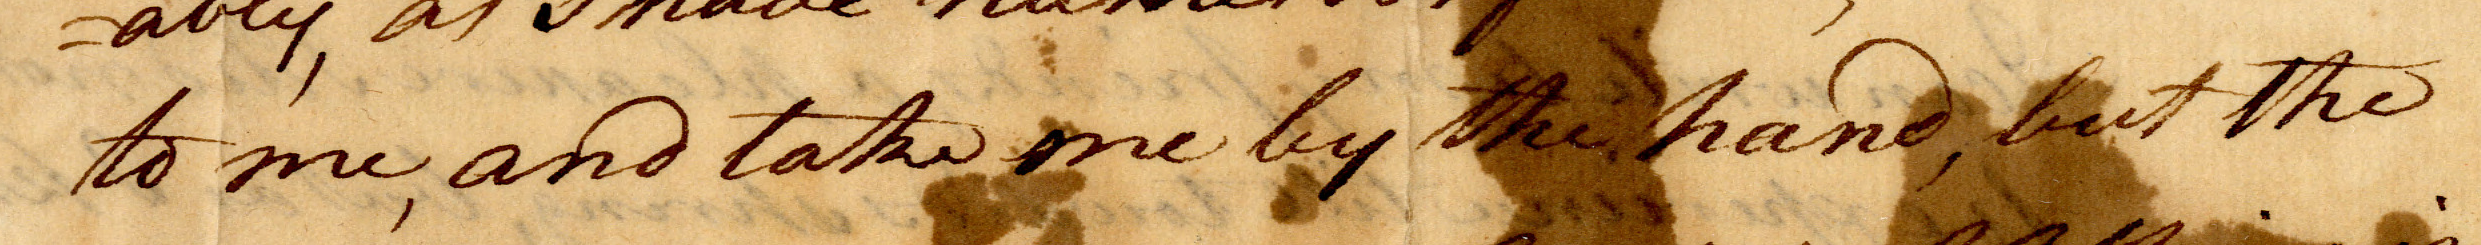to me, and take me by the hand, but the
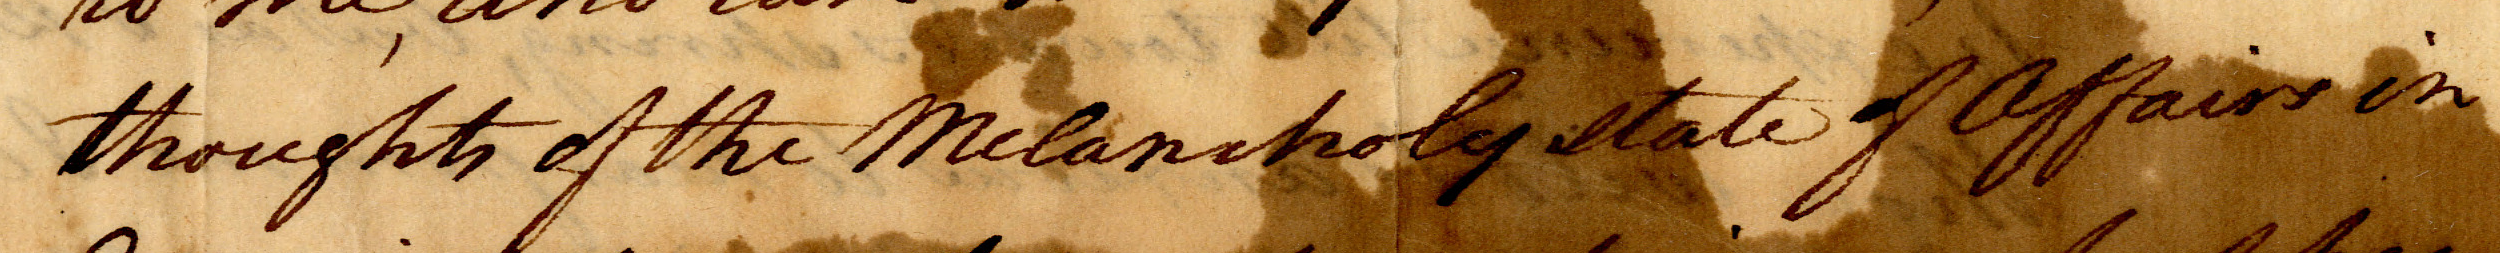thoughts of the Melancholy state of Affairs in
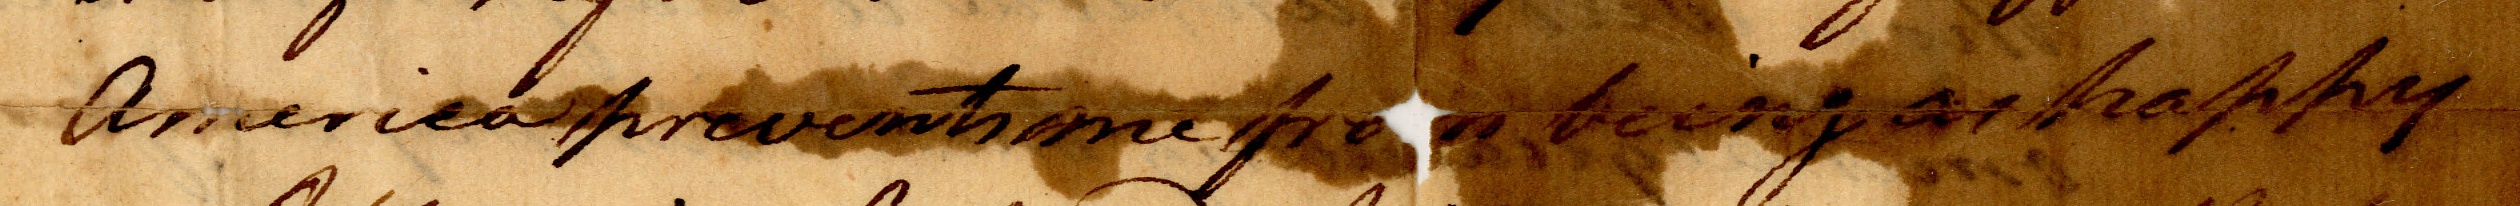America prevents me from being as happy
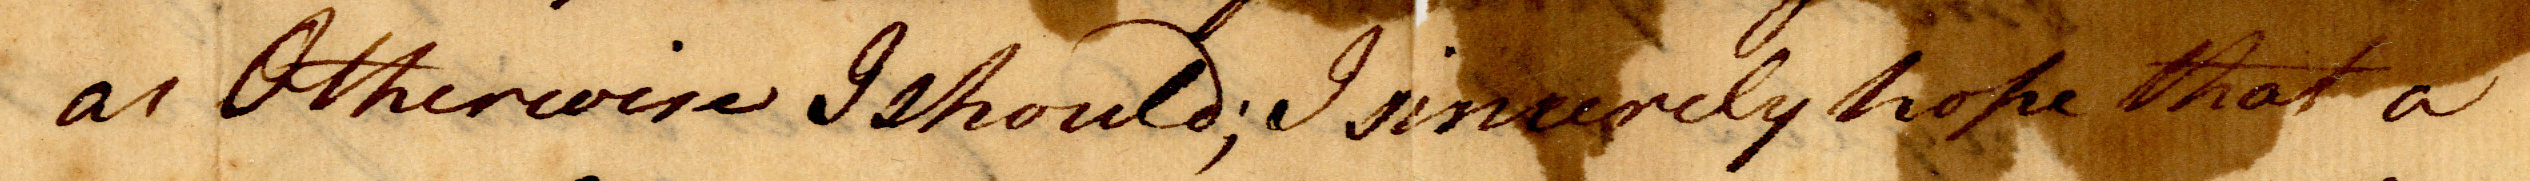as Otherwise I should; I sincerely hope that a
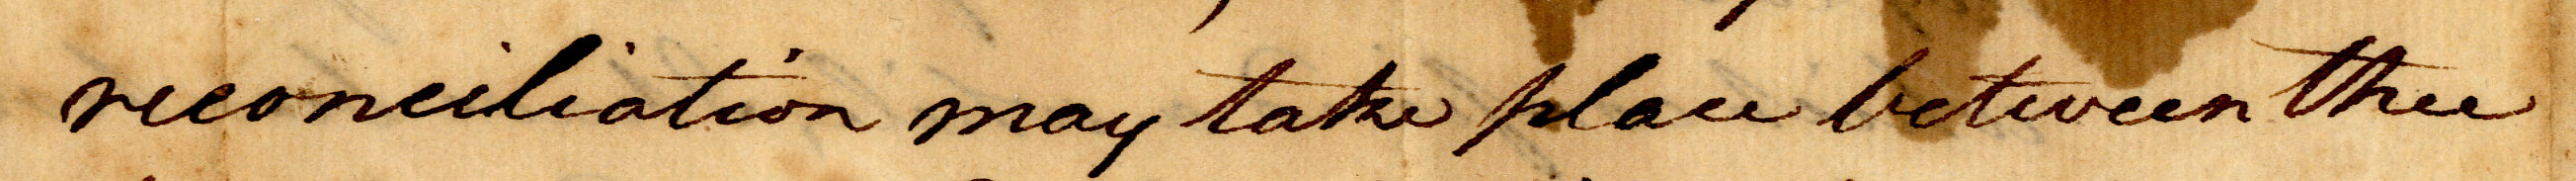reconciliation may take place between thee
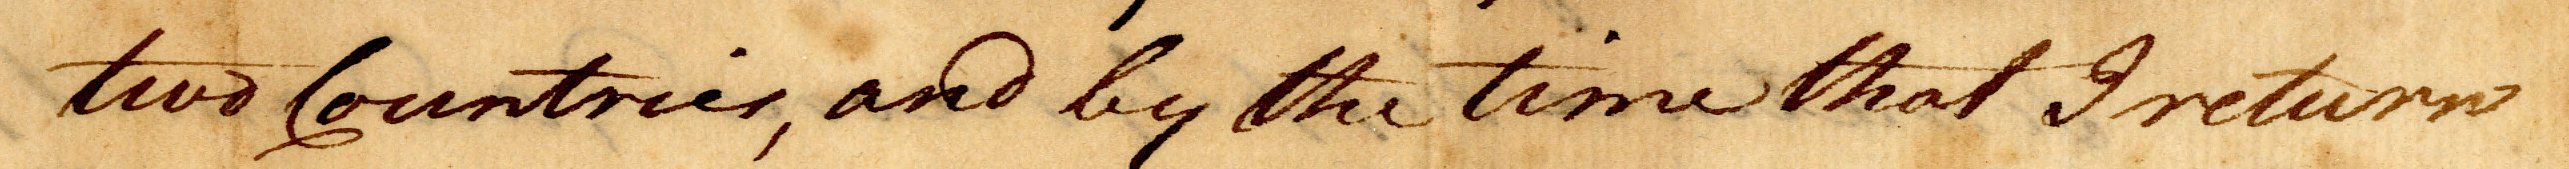two Countries, and by the time that I return
